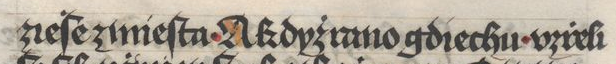zieẛe z míeſta. A kdyż rano gdíechu.vzṙeli
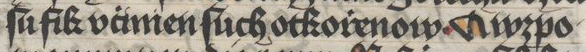ſu fik vċinien ſuch otkoṙenow. A wzpo¬
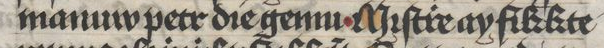manuw petr díe gemu.Miſtṙe ay fik kte¬
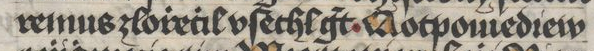remus zloṙeċil vſechl ḡt.A otpowiediw
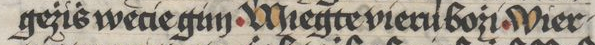geżíṡ wecie gím.Miegte vieru bożí.Vier¬
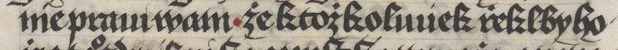mé praui wam.że ktoż koluiek ṙeklbyho
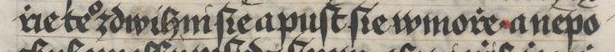ṙíe teo zdwihni ſie a puſt ſie w moṙe.a nepo¬
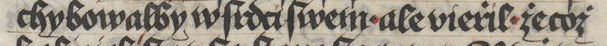chy bowalby wſrdci ſwem.ale vieṙil.że coż
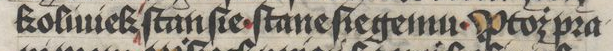koliuiek ſtan ſie.ſtane ſie gemu.Ꝓtoż pra¬
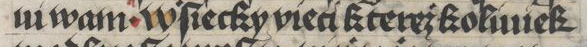uí wam.Wẛiecky víeci ktereżkoliuiek
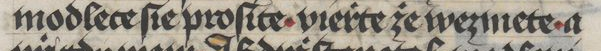modlece ſie proſíte.vieṙte że wezmete.a
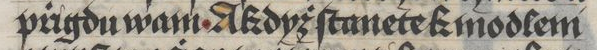pṙigdu wam.A kdyż ſtanete k modlení
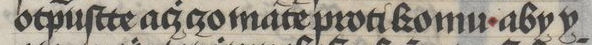otpuſtte acż czo mate proti komu.aby y
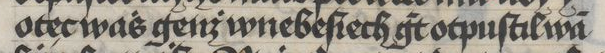otec waṡ genż wnebeſíech ḡt otpuſtil wā¬
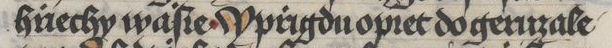hṙíechy waẛie.Y pṙigdu opiet do geruzale¬
